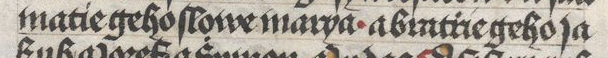matie geho ſlowe marya.a bratṙie geho Ia¬
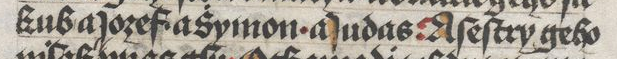kub a Iozef.a ṡymon.a Iudas?Aſeſtry geho
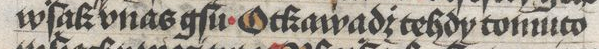wẛak vnas gſu.Otkawadż tehdy tomuto
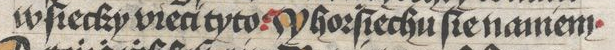wẛiecky vieci tyto?Yhorẛíechu ſie naniem.
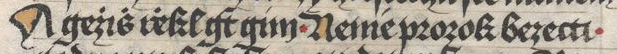A geżiṡ ṙekl ḡt gim.Neníe prorok bezecti.
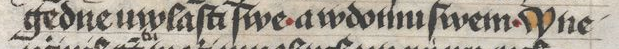gedne uwlaſti ſwe.a wdomu ſwem.Y ne¬
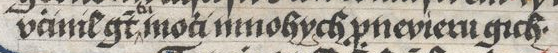uċinil ḡt tú moċí mnohych ꝓnevieru gich.
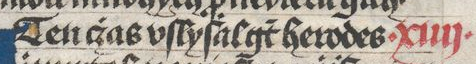Ten cżas uſlyſal ḡt herodes.xiiij¬
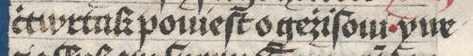ċtwrtak pouieſt o geżiẛowi.y we¬
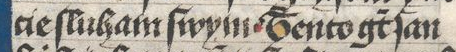cie ſluham ſwym.Tento ḡt Ian
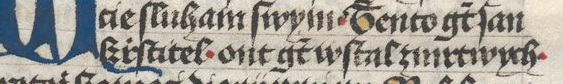kṙſtitel.ont ḡt wſtal zmrtwych.
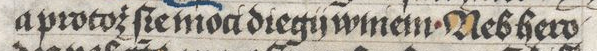a protoż ſie moci diegij wnem.Neb hero¬
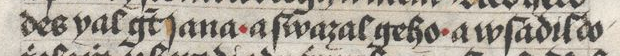des yal ḡt Iana.a ſwazal geho.a wſadil do¬
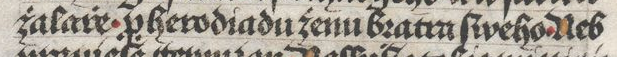żalaṙe.Ꝓherodiadu żenu bratra ſweho.Neb
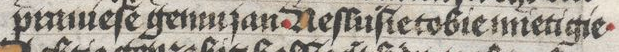prauieẛe gemu Jan.Neſluẛie tobie mieti gíe
